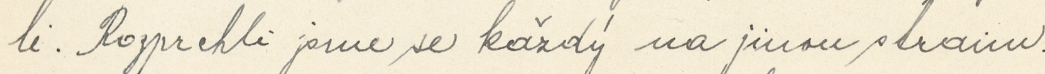li. Rozprchli jsme se každý na jinou stranu.
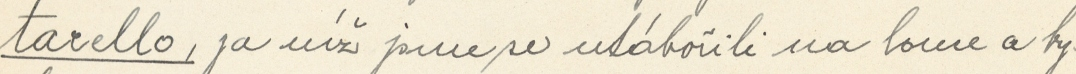tarello, za níž jsme se utábořili na louce a by-
